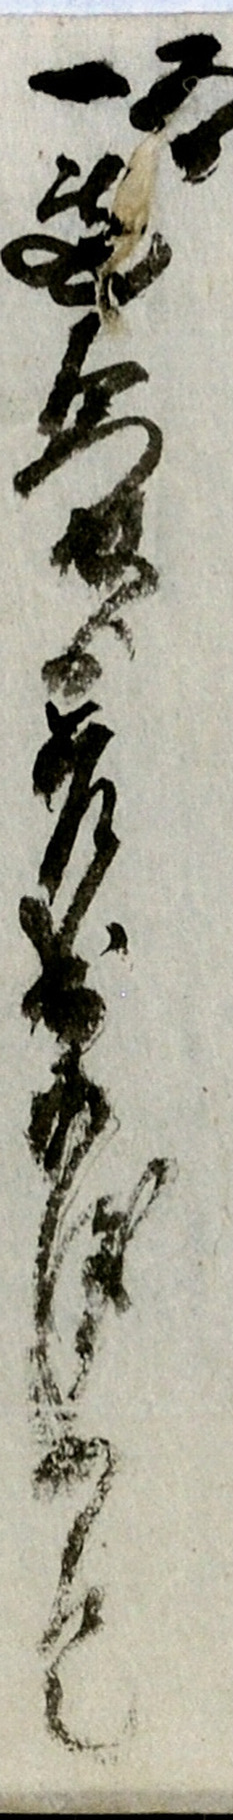一団右衛門殿ゟ差出被渡候左之
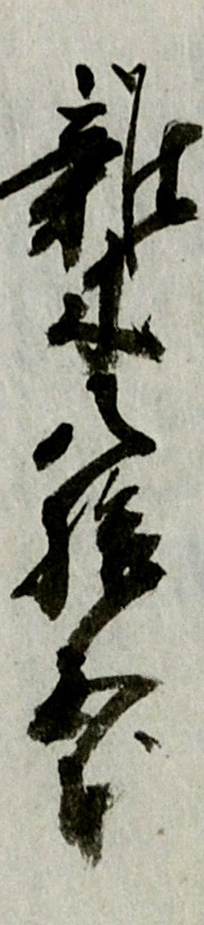雑木八拾五本
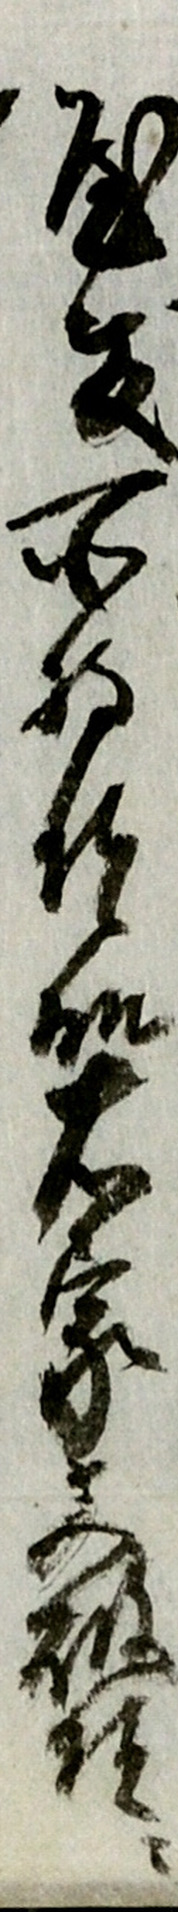屋敷所持仕候処右家大破損ニ
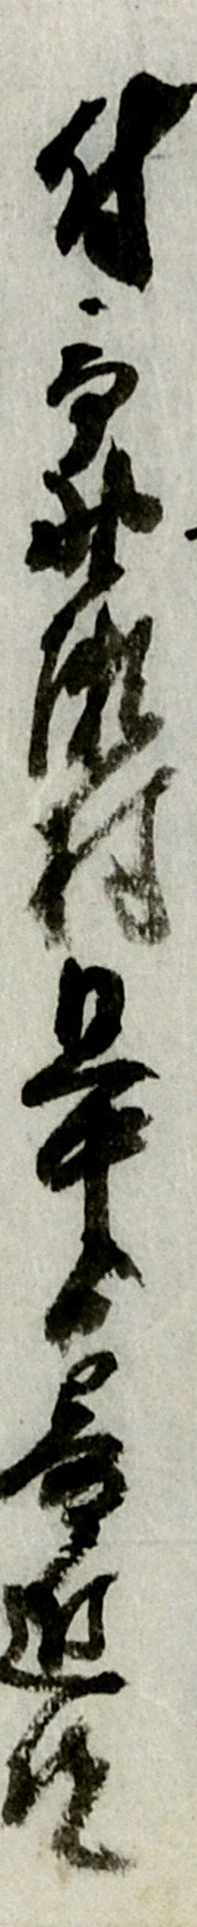付高野瀬村旦中ゟ寄進仕候
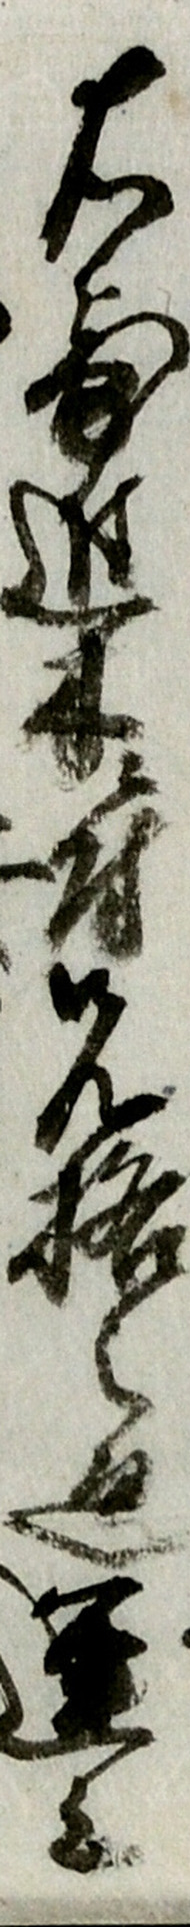右寄進木ニ付先格之通運上
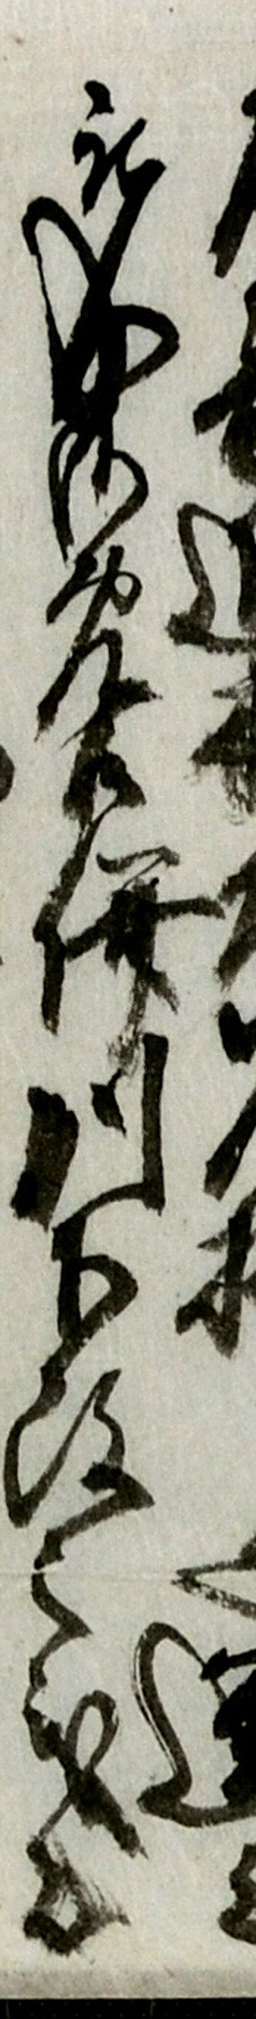被成御免候併川下改之義は
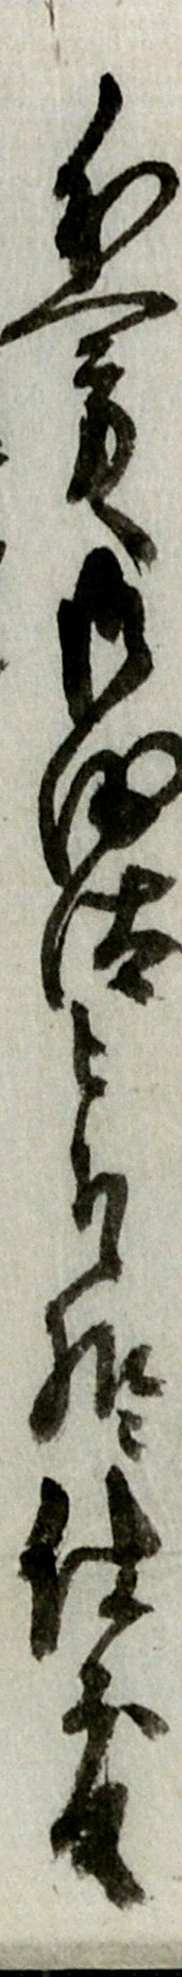分一方へ御沙汰被下候様ニ仕度
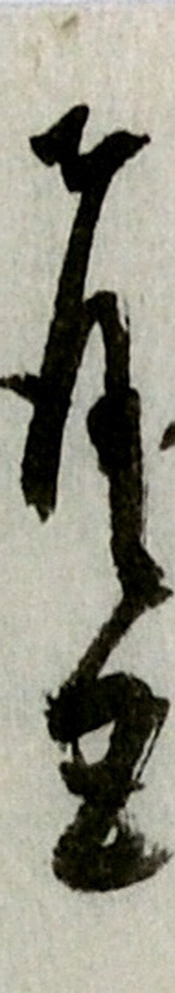奉存候以上
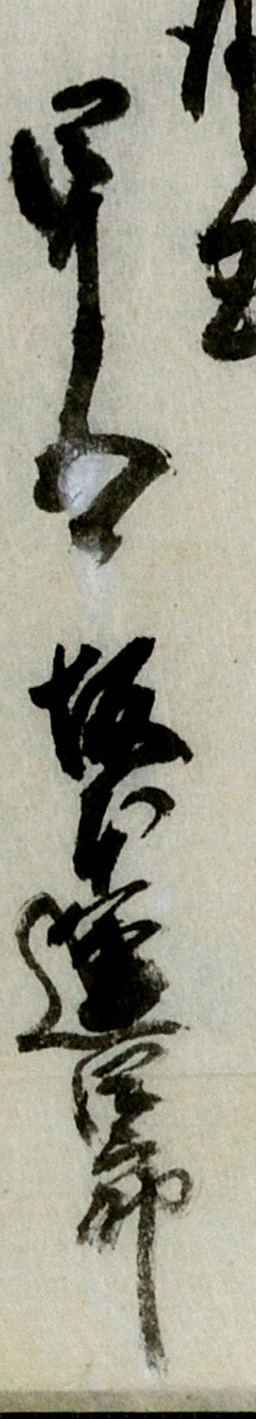四月五日坂本運四郎

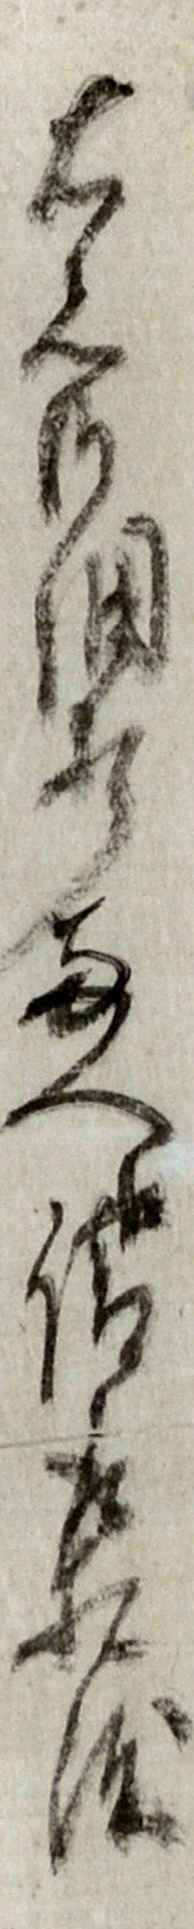右は御網打両人え請取相渡
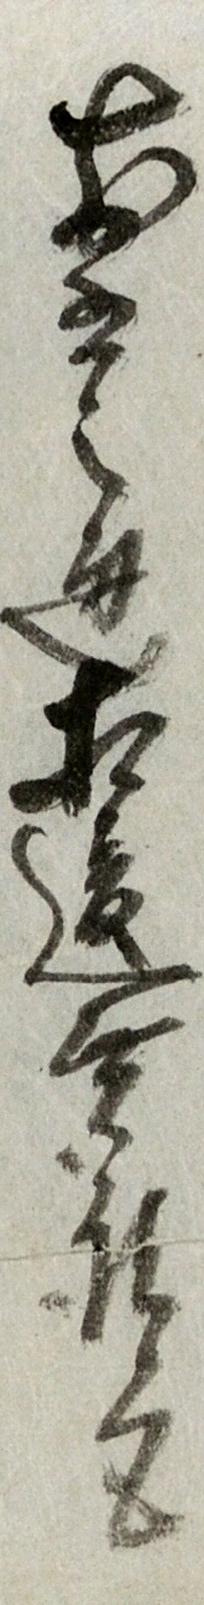前書之通相違無御座候以上
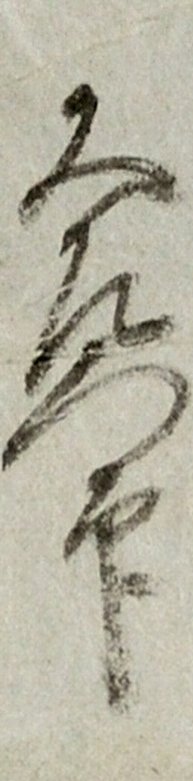久左衛門印
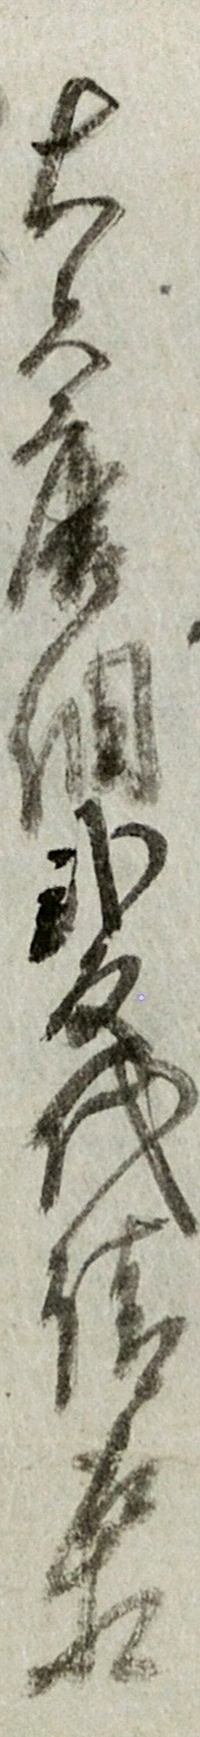右は唐網弐反代請取相
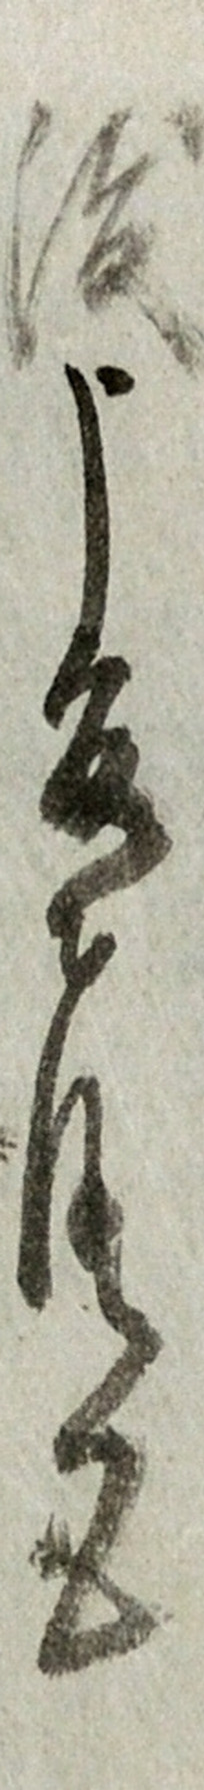渡申度奉存候以上
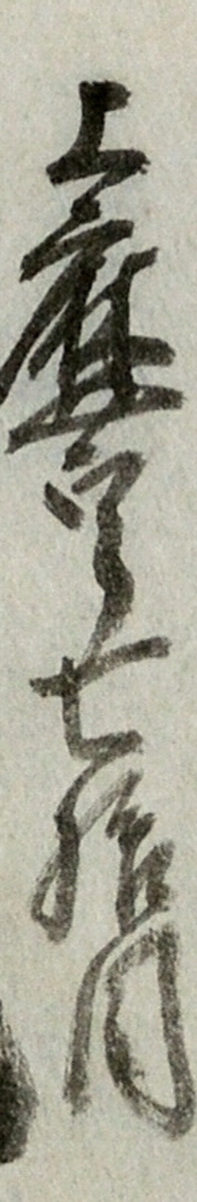上麻苧七拾目
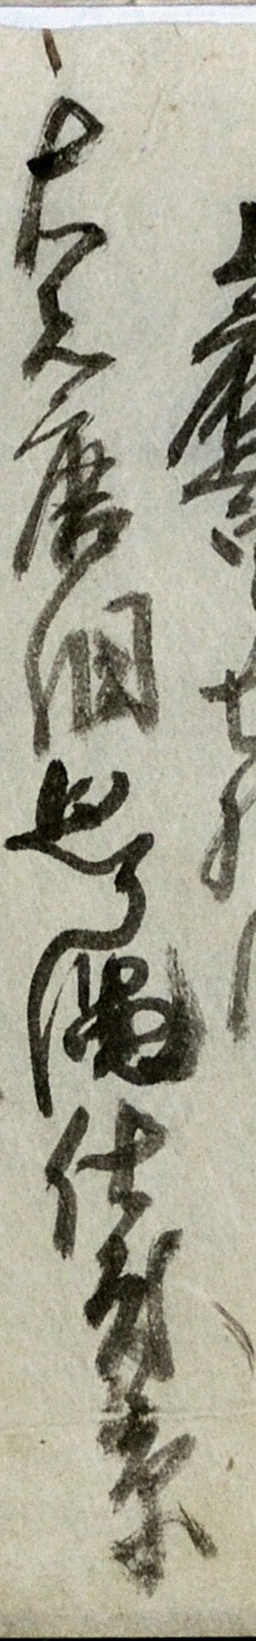右は唐網廻り縄仕付糸
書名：分一方諸事御用留帳
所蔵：伊那市立高遠町図書館・合同会社AMANE
